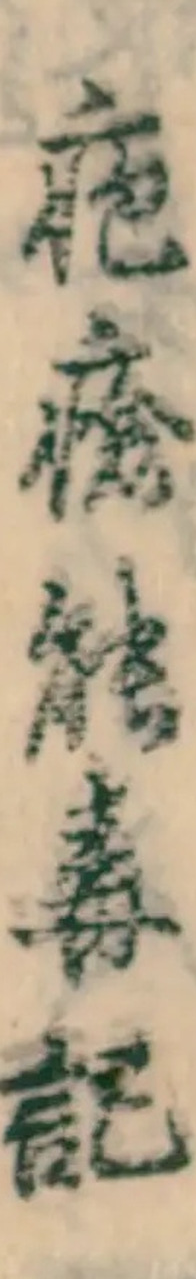疱瘡能毒記
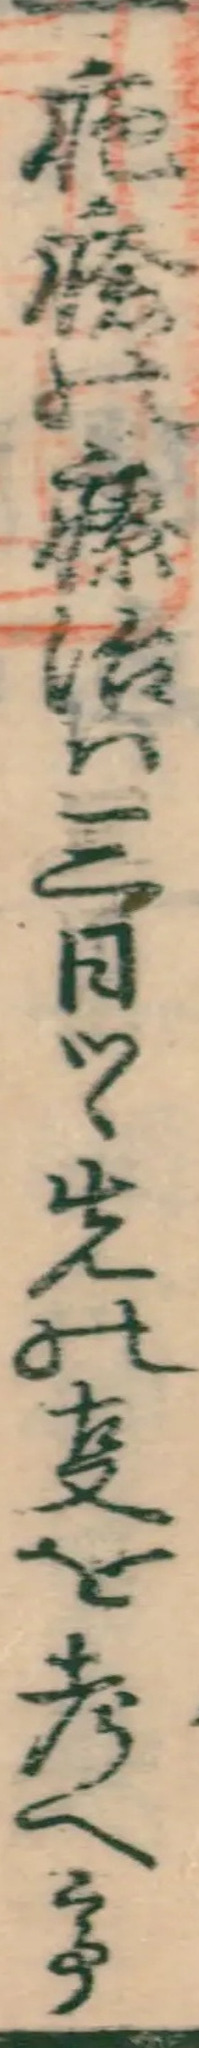一疱瘡の療治は三日ツヽ先の事を考へて
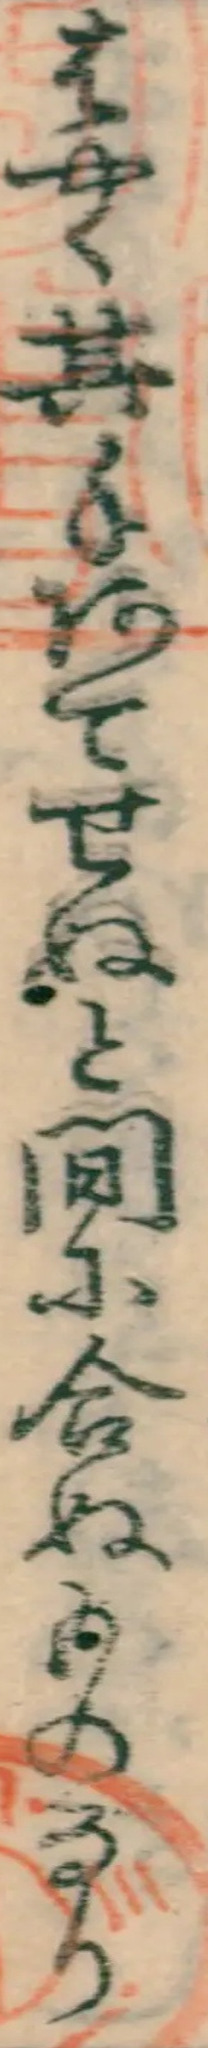はやく其手あてせぬと間に合ぬものなり
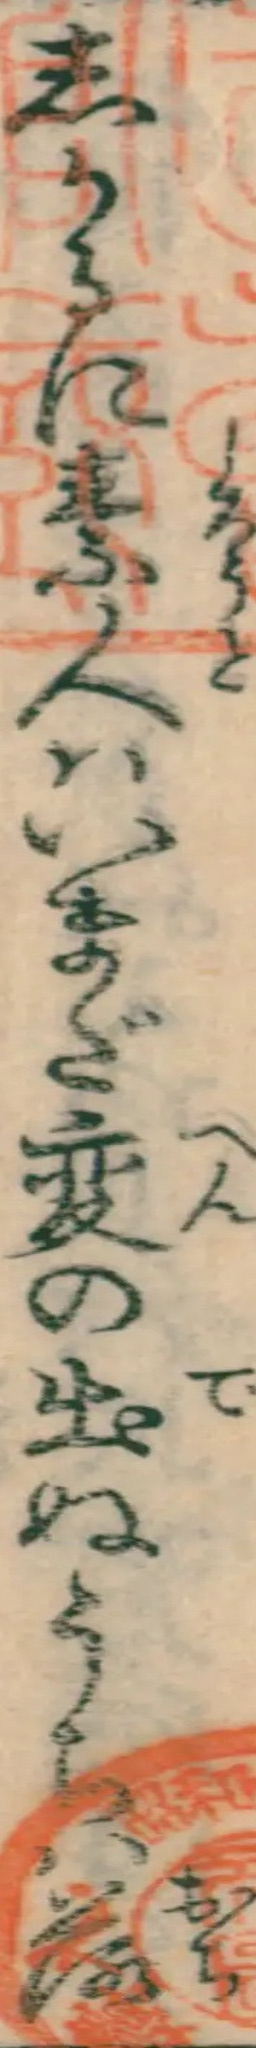しかるに素人はいまだ変の出ぬうちは落
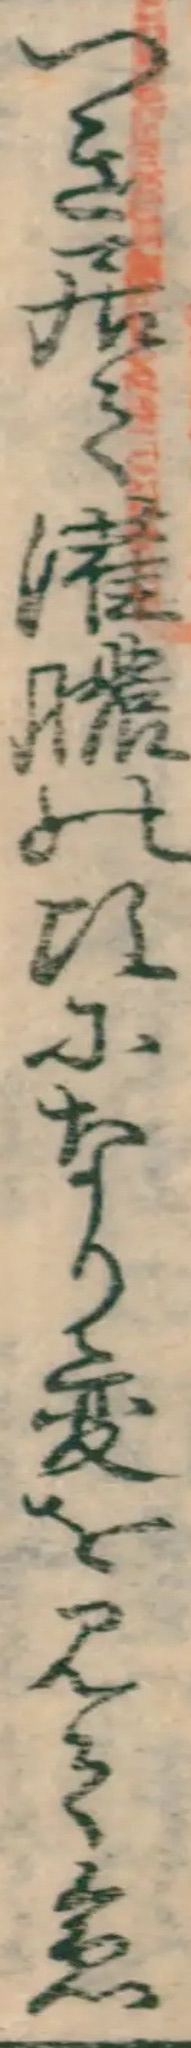つき居て潅膿の頃になり変を見て急
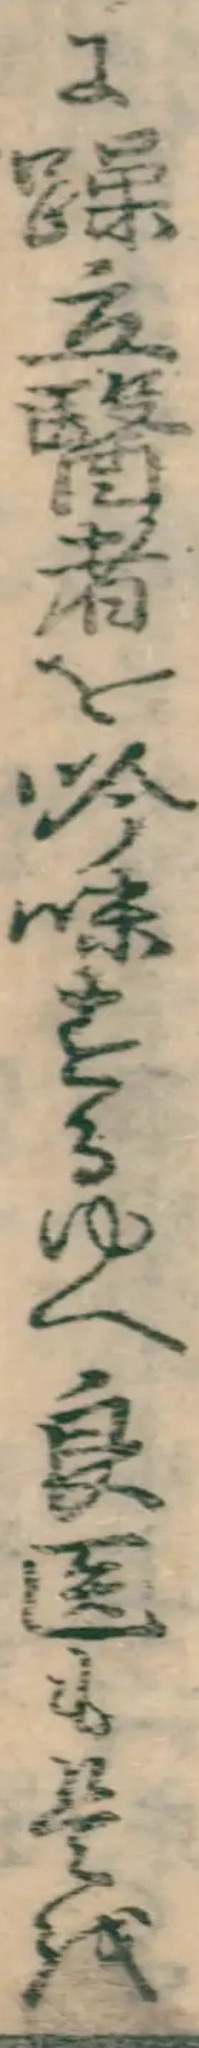に躁立医者を吟味するゆへ良医も是を

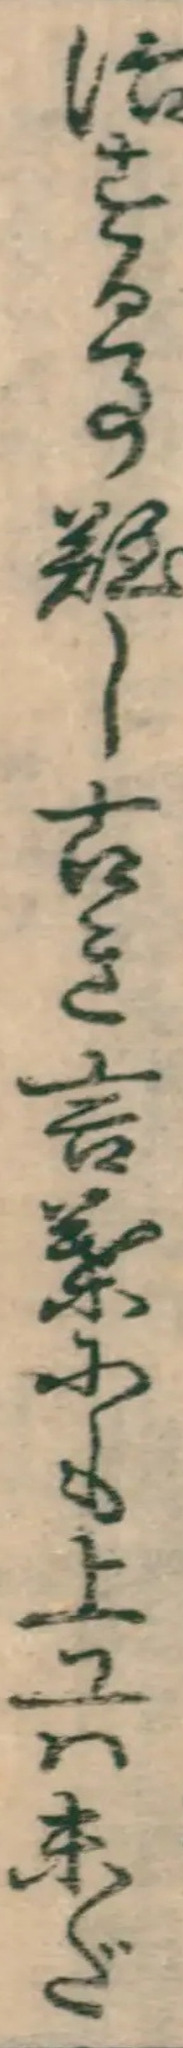治する事難し古き言葉にも上工は未だ
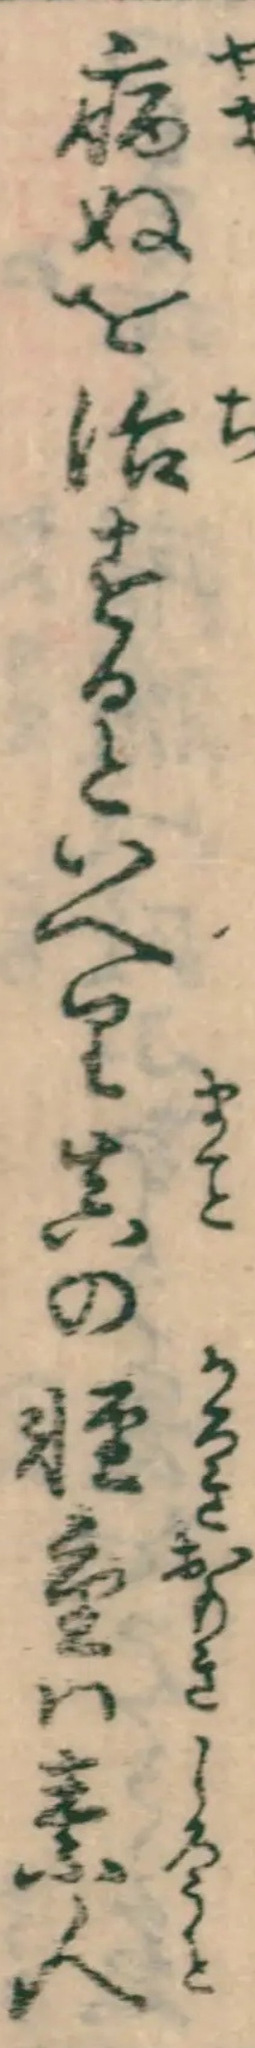病ぬを治するといへり真の軽重は素人
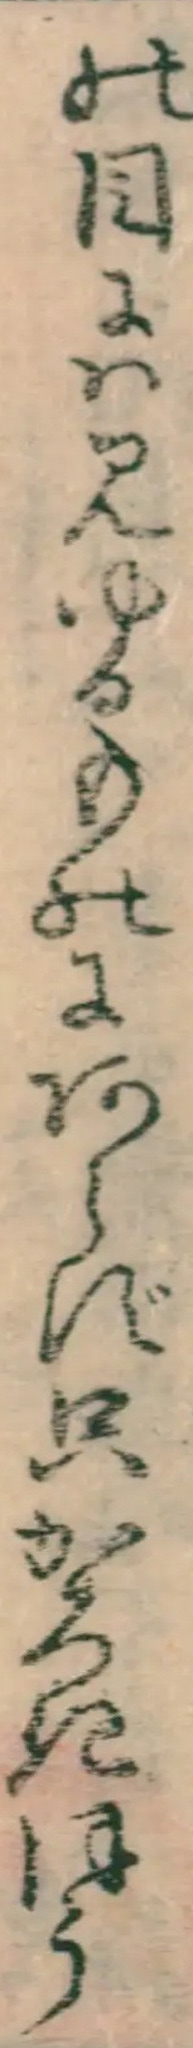の目には見ゆるものにあらず只かろきほう
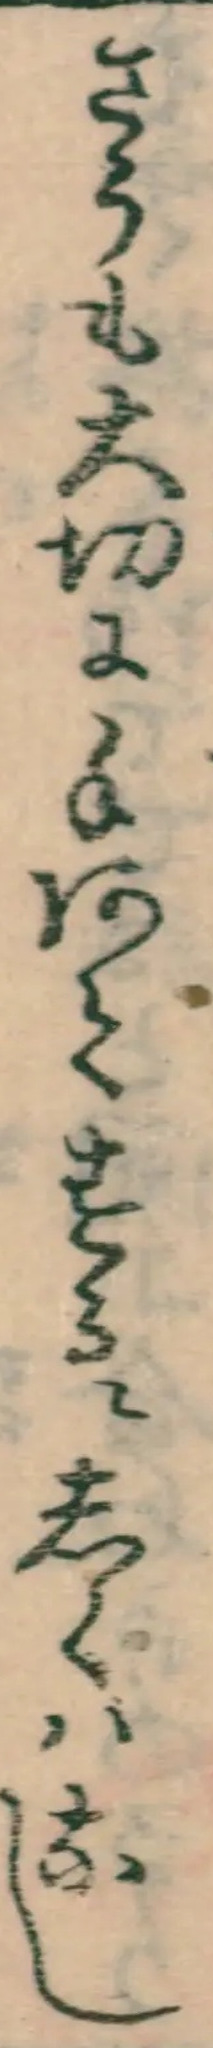さうも大切に手あてするにしくはなし
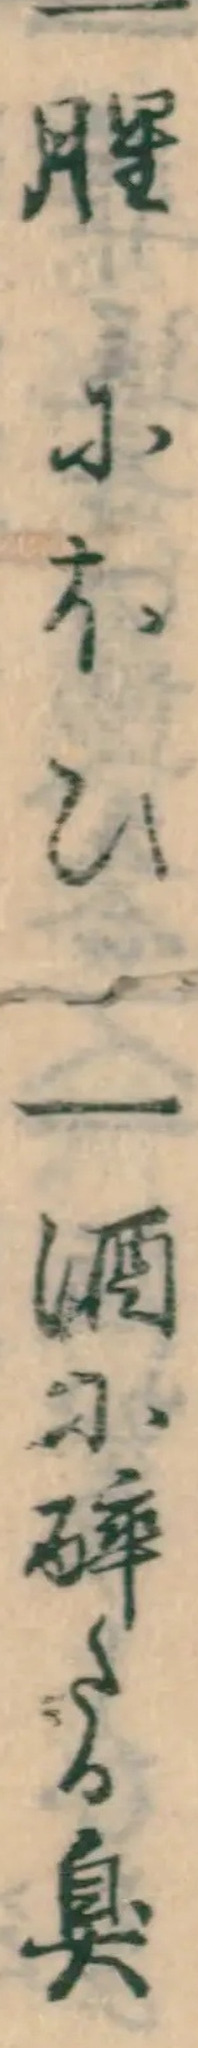一腥にほひ一酒に酔たる臭
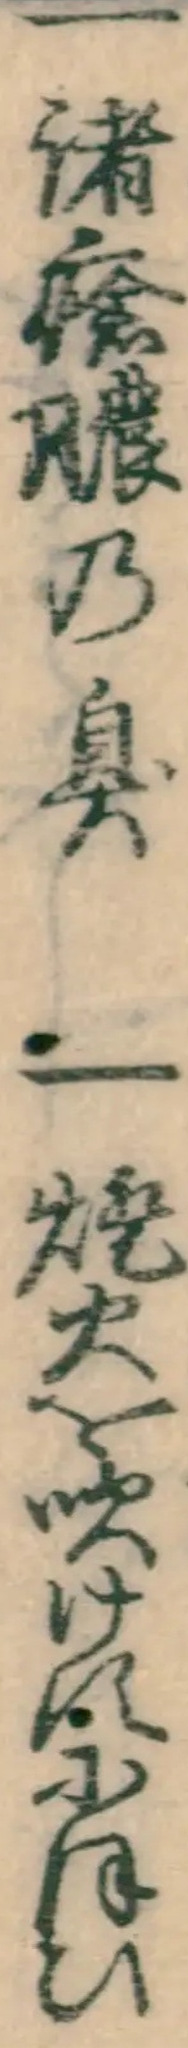一諸瘡膿の臭一焼火を吹けすにほひ
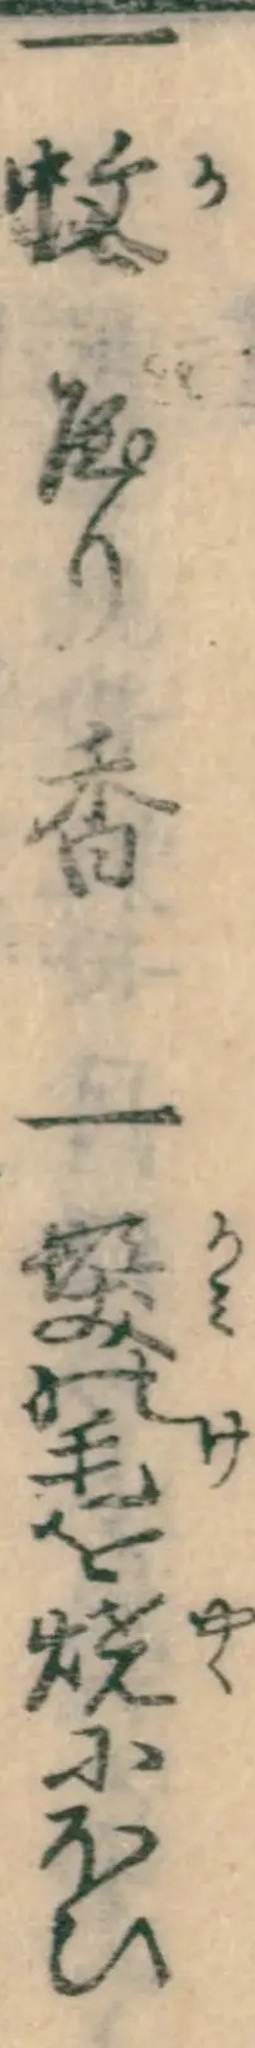一蚊やり香一髪の毛を焼にほひ
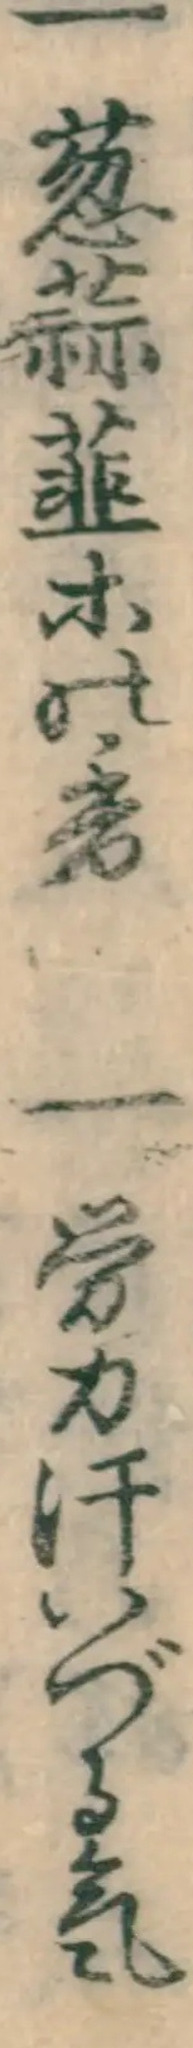一葱蒜韮等の香一労力汗いづる気
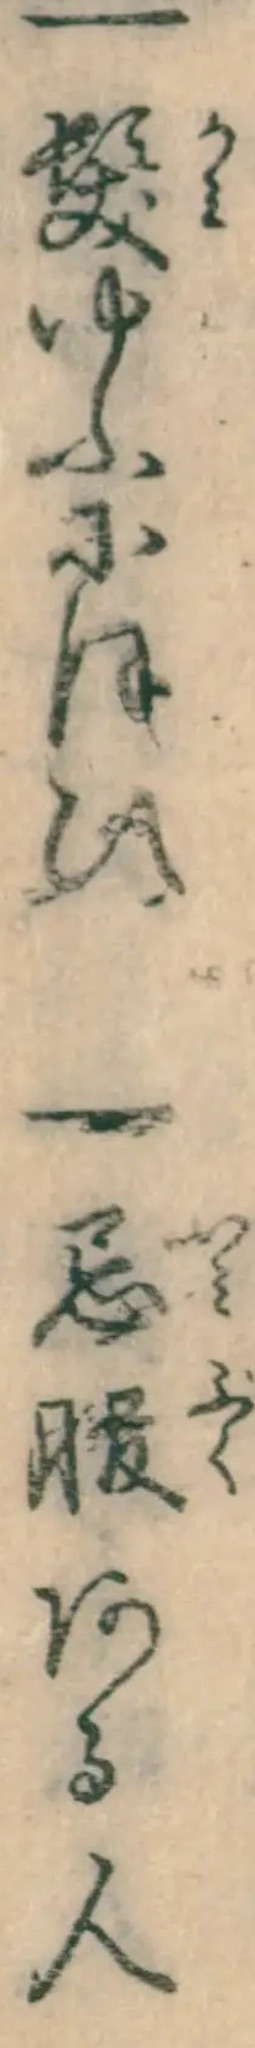一髪ゆふにほひ一忌服ある人

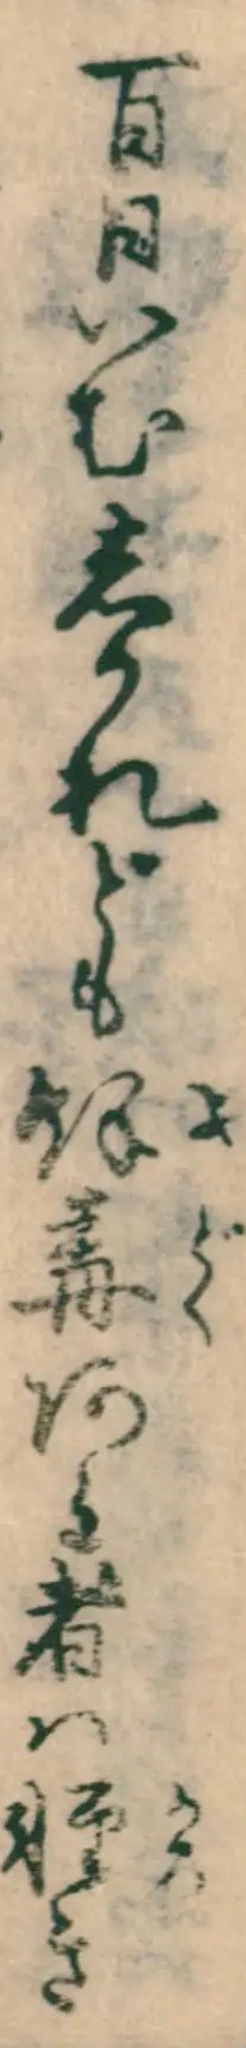百日いむしかれども余毒ある者は軽き
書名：疱瘡能毒記
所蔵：国立国会図書館 National Diet Library, JAPAN
